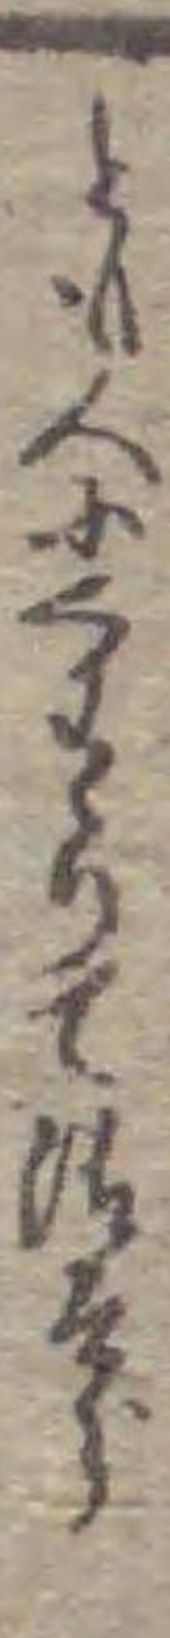とも人にくわゝりて清太郎
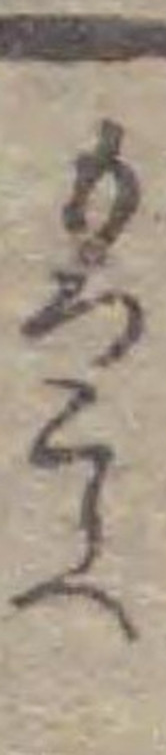もろこしへ
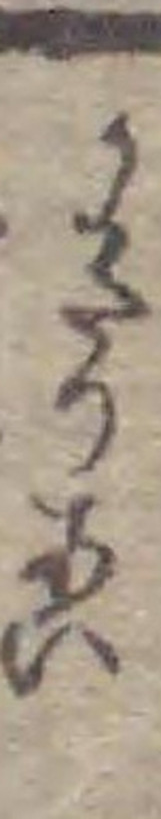わたりあい
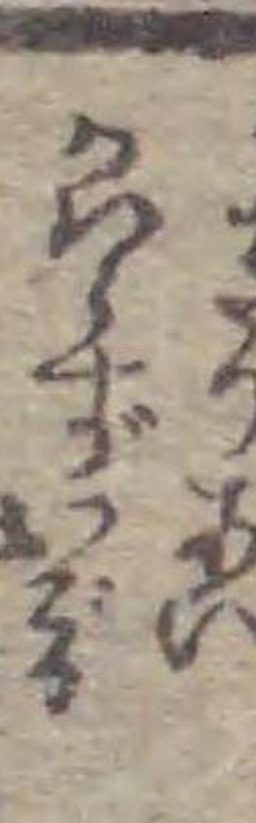かはらずおごる
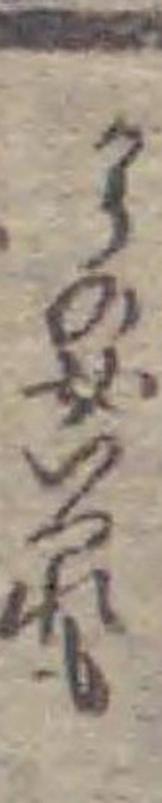からの女いつれも
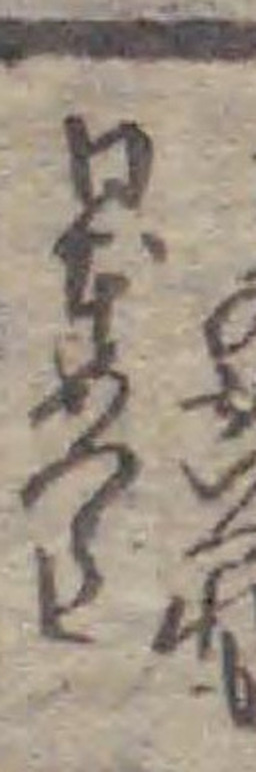日本めつらしく
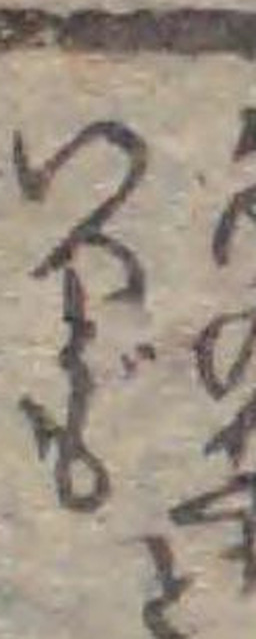いへども
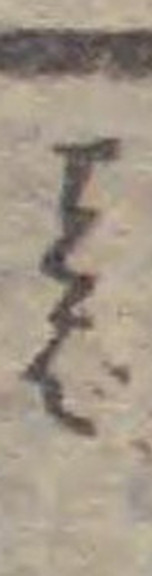ことば
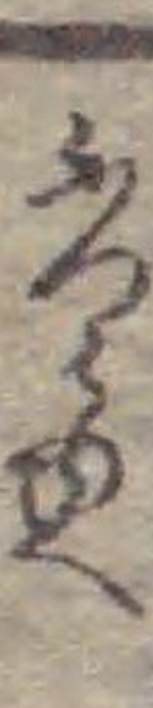ふつうゆへ
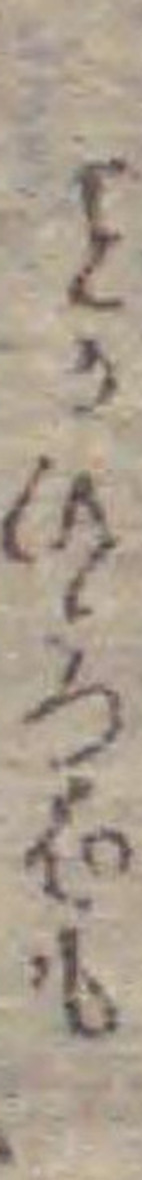ことかひとつばも
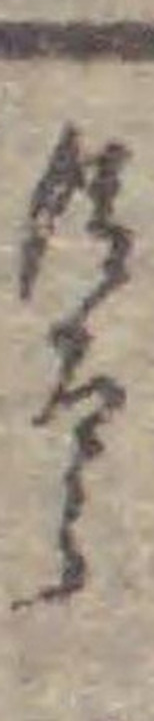清太郎
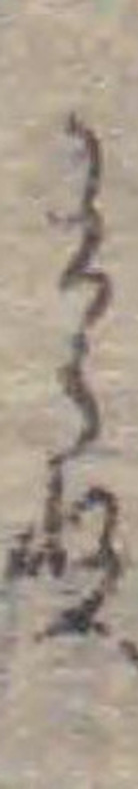わからねへ
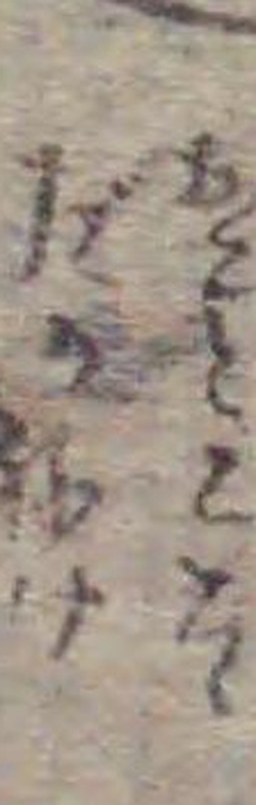だかねけ
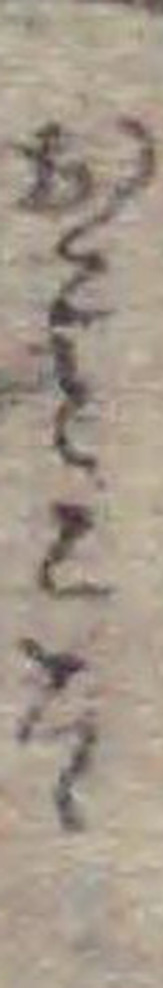おことここゝ
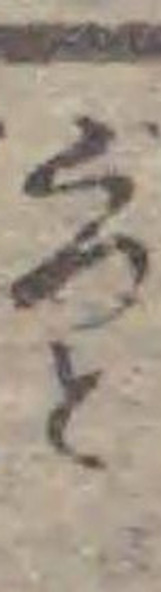ぐつと
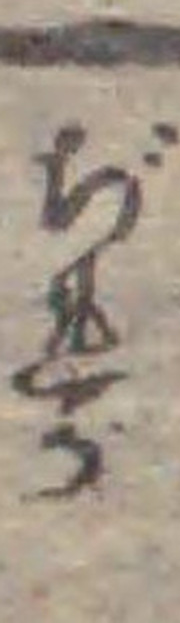ぢれが
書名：見徳一炊夢 : 3巻
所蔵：国立国会図書館 National Diet Library, JAPAN
